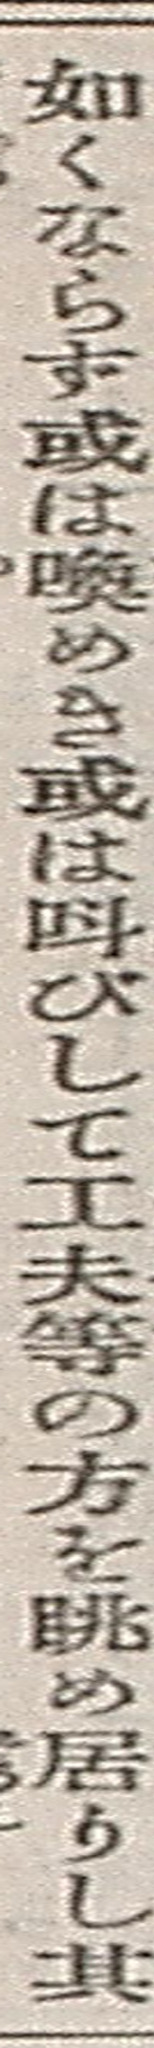如くならず或は喚めき或は叫びして工夫等の方を眺め居りし其
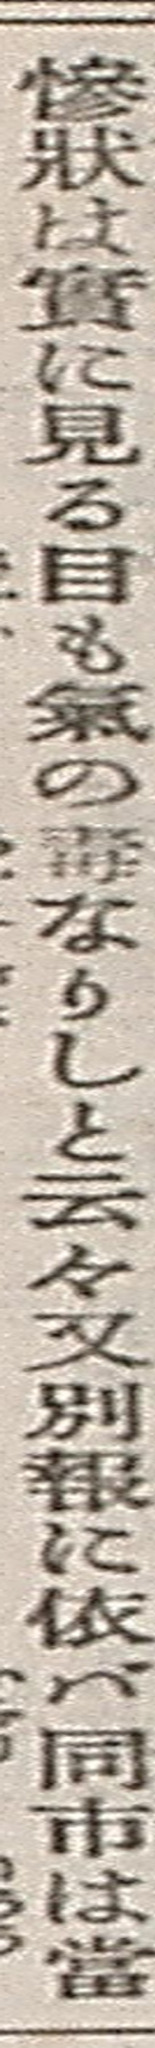惨状は実に見る目も気の毒なりしと云々又別報に依ば同市は当
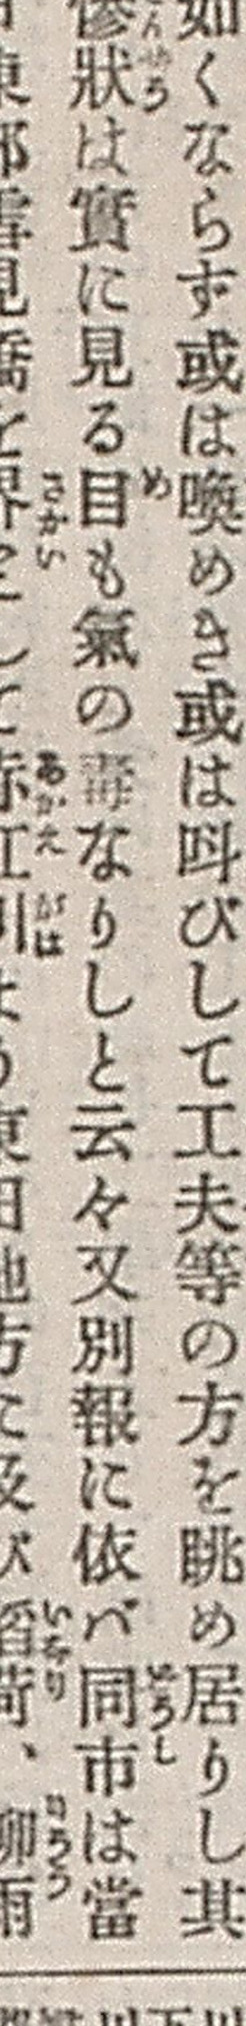惨状は実に見る目も気の毒なりしと云々又別報に依ば同市は当
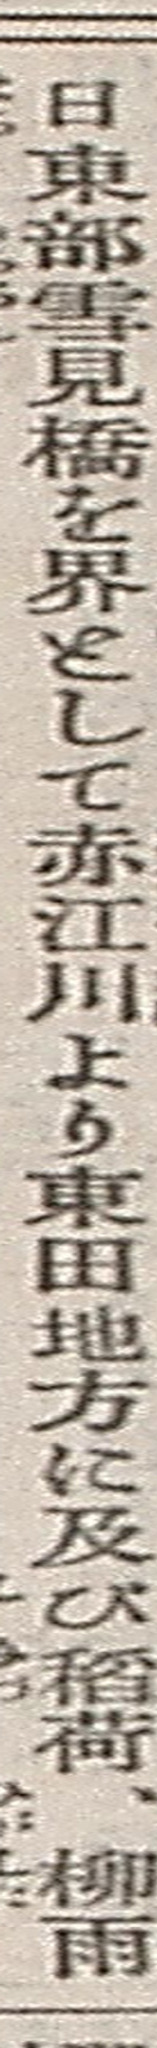日東部雪見橋を堺として赤江川より東田地方に及び稲荷、柳雨
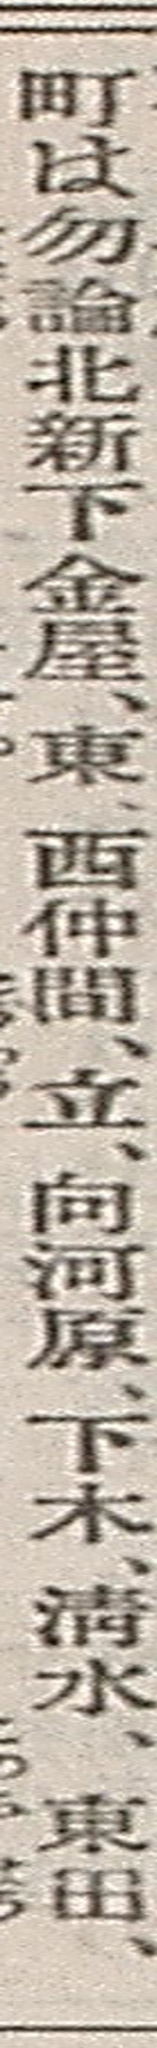町は勿論北新下金屋、東、西仲間、立、向河原、下水、清水、東田、
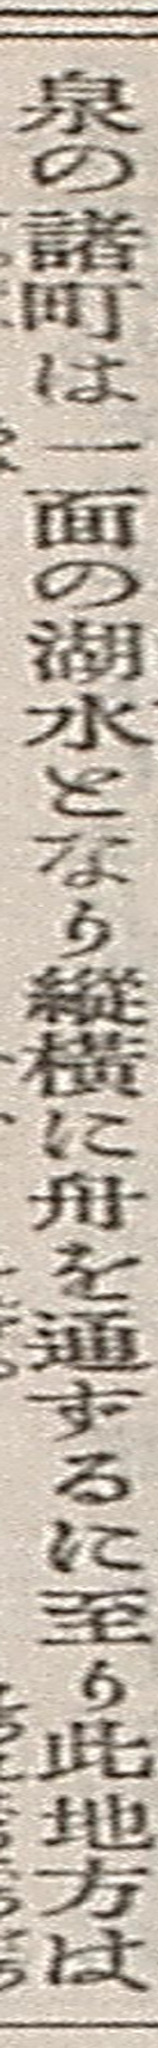泉の諸町は一面の湖水となり縦横に舟を通ずるに至り此地方は
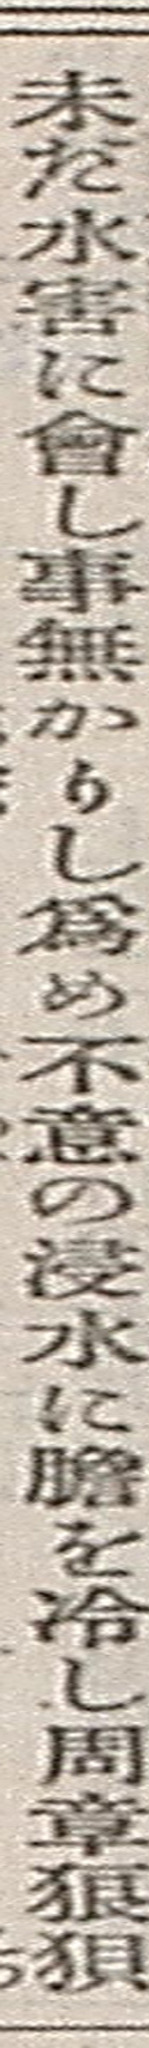未だ水害に会し事無かりし為め不意の浸水に膽を冷し周章狼狽
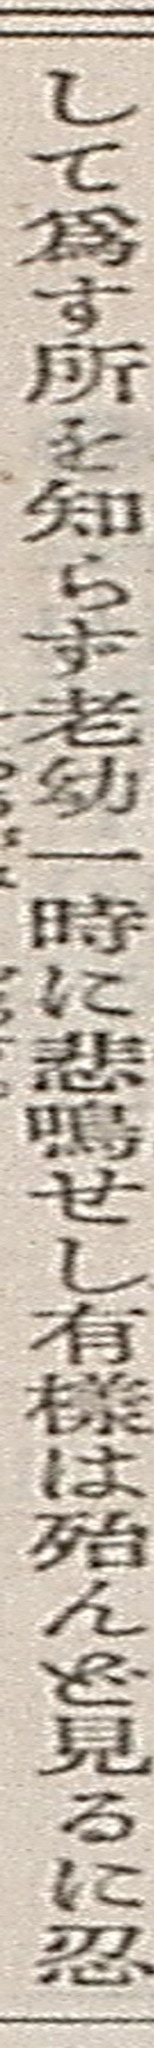して為す所を知らず老幼一時に悲鳴せし有様は殆んど見るに忍
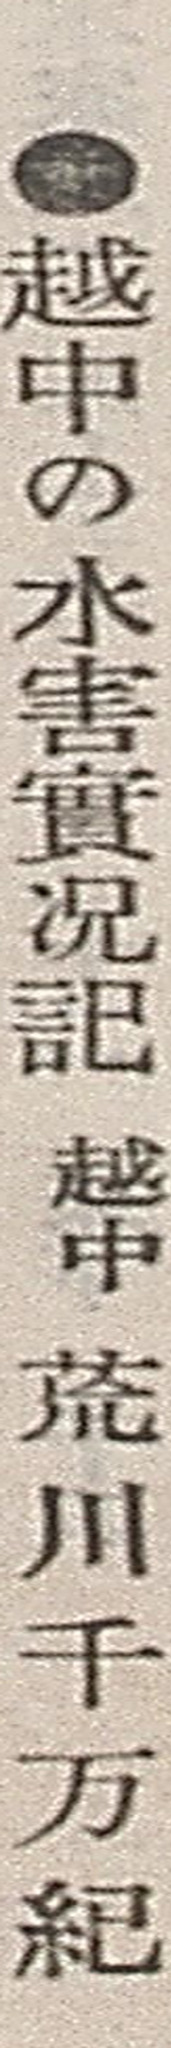●越中の水害実況記越中荒川千万紀
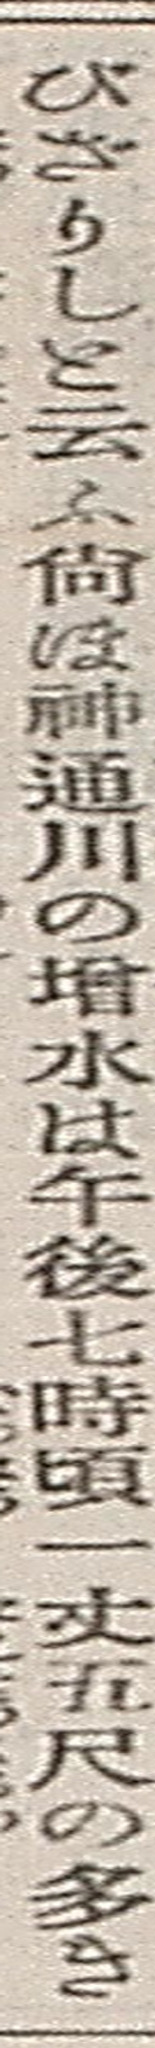びざりしと云ふ尚ほ神通川の増水は午後七時頃一丈五尺の多き
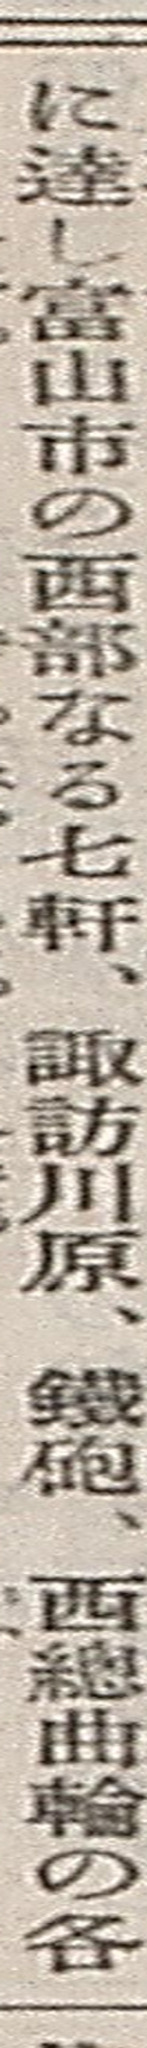に達し富山市の西部なる七軒、諏訪川原、鉄砲、西総曲輪の各
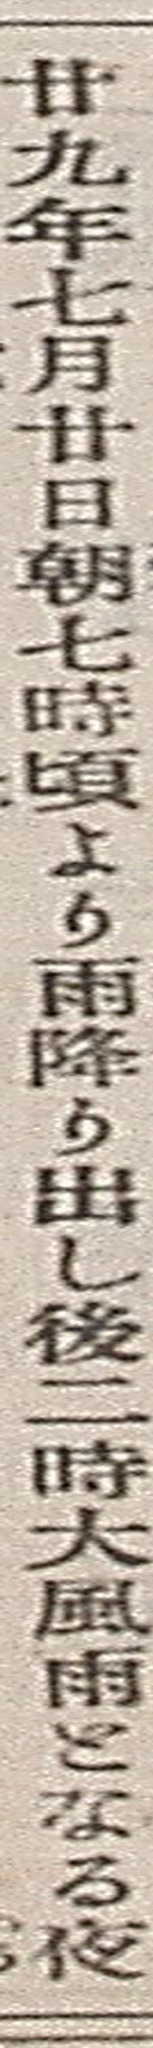廿九年七月廿日朝七時頃より雨降り出し後二時大風雨となる夜
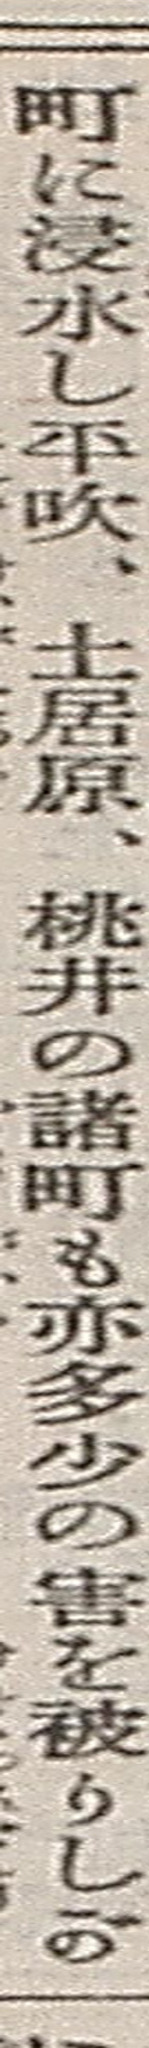町に浸水し平吹、土居原、桃井の諸町も亦多少の害を被りしが
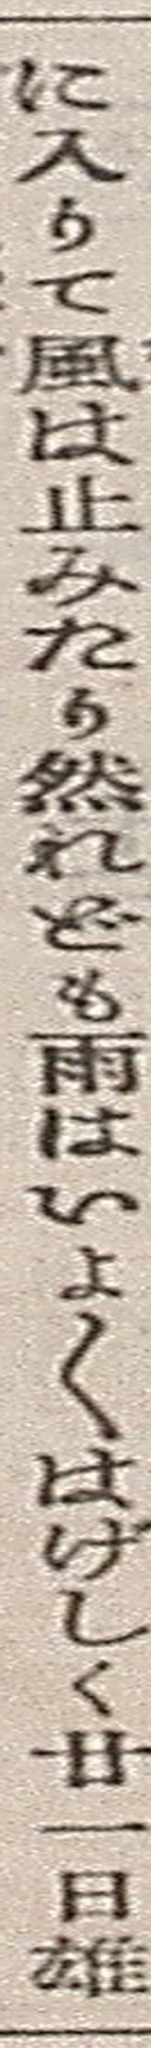に入りて風は止みたり然れども雨はいよ〳〵はげしく廿一日雄
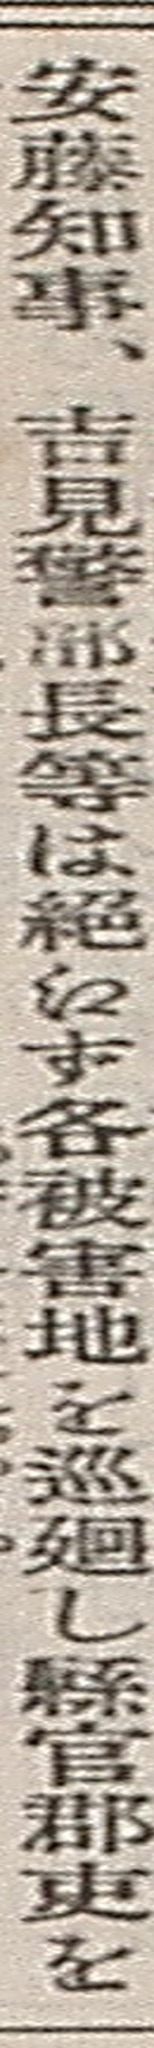安藤知事、吉見警部長等は絶えず各被害地を巡廻し県官郡吏を
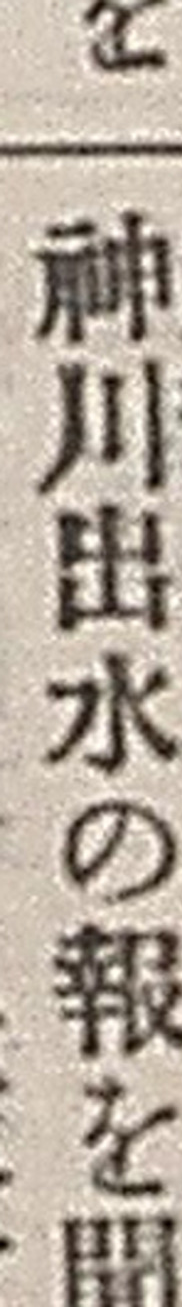神川出水の報聞く
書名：風俗畫報臨時増刊第百二十八號　洪水被害録（下）
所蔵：東京大学地震研究所図書室 Earthquake Research Institute Library, The University of Tokyo, JAPAN
